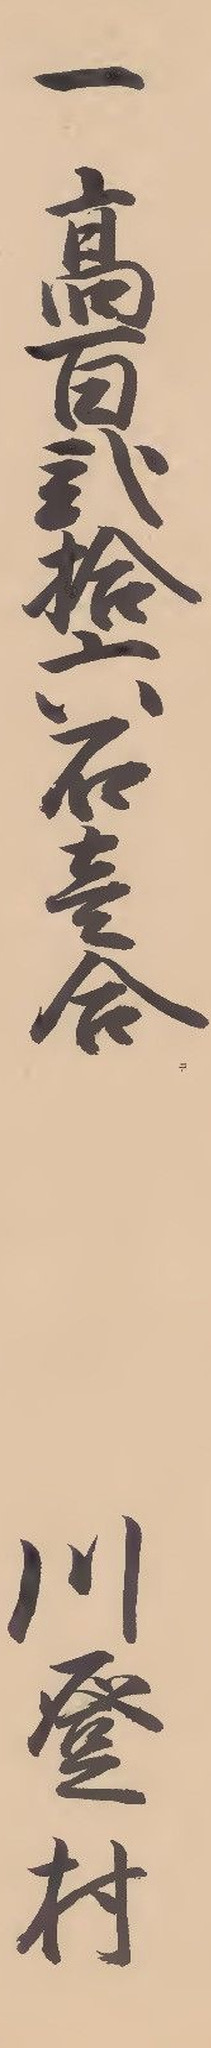一高百弐拾六石壱合川登村

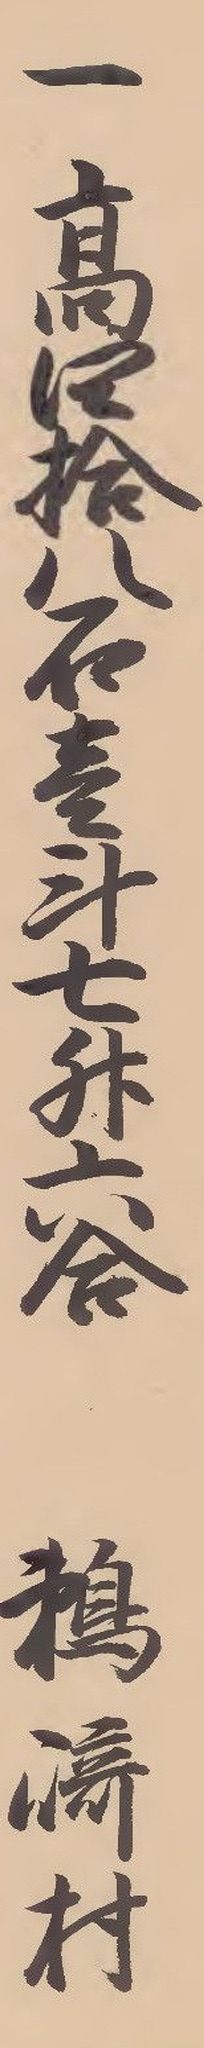一高四拾八石壱斗七升六合鵜崎村
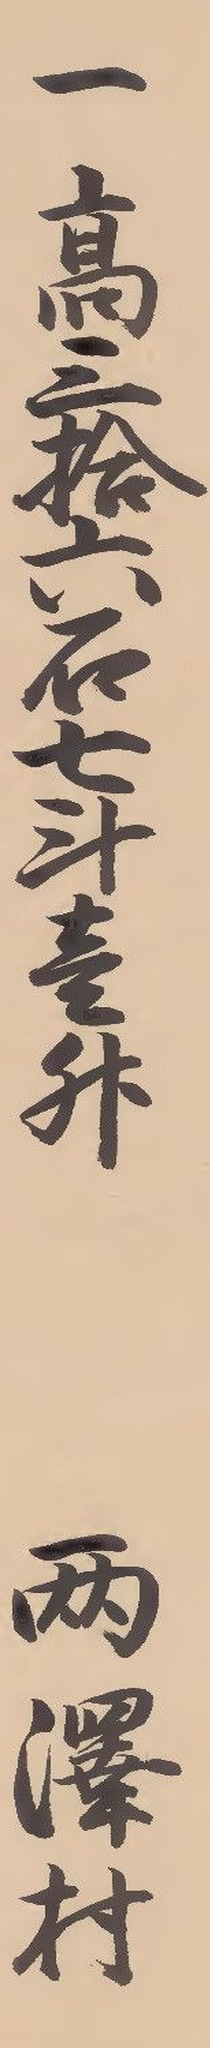一高三拾六石七斗壱升両沢村
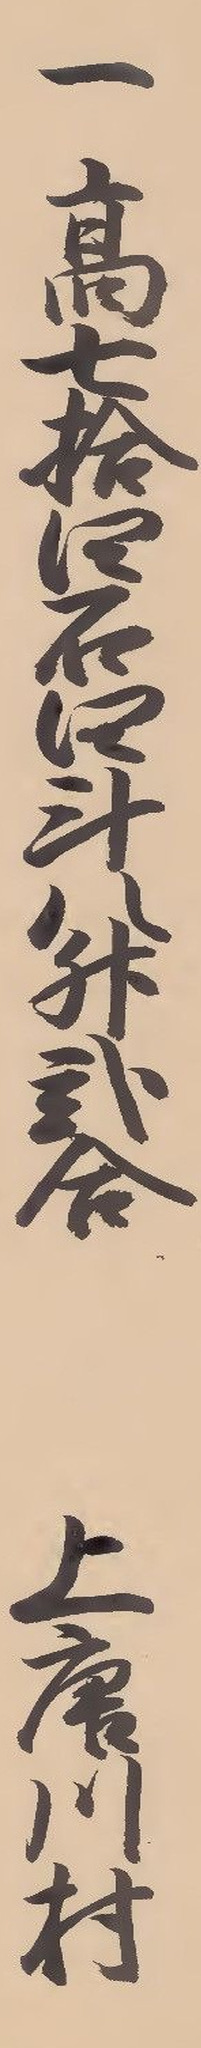一高七拾四石四斗八升弐合上唐川村
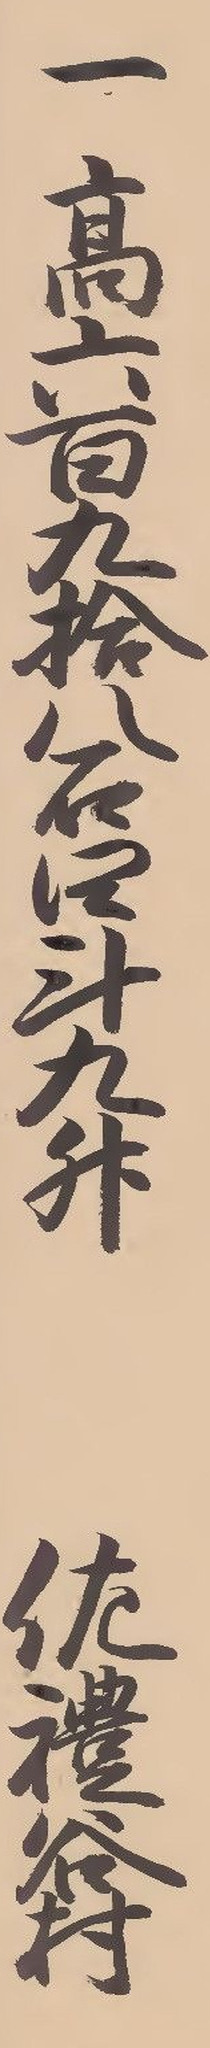一高六百九拾八石四斗九升佐礼谷村
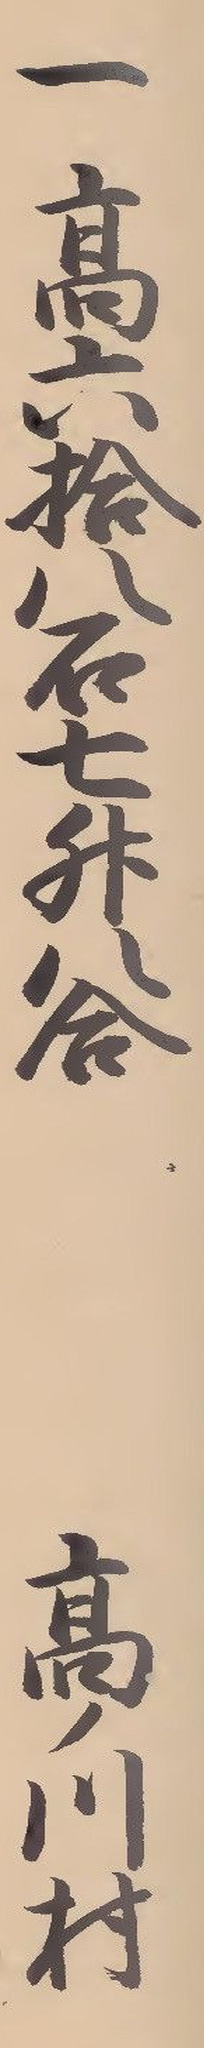一高六拾八石七升八合高ノ川村
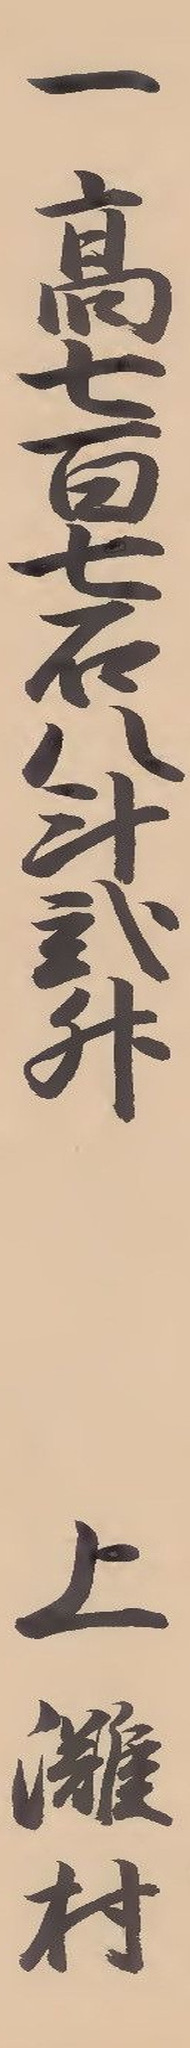一高七百七石八斗弐升上灘村
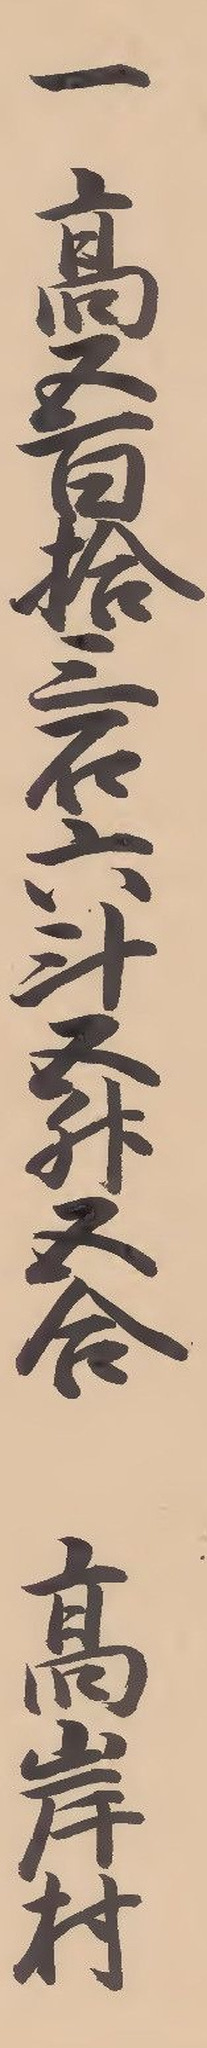一高五百拾三石六斗五升五合高岸村
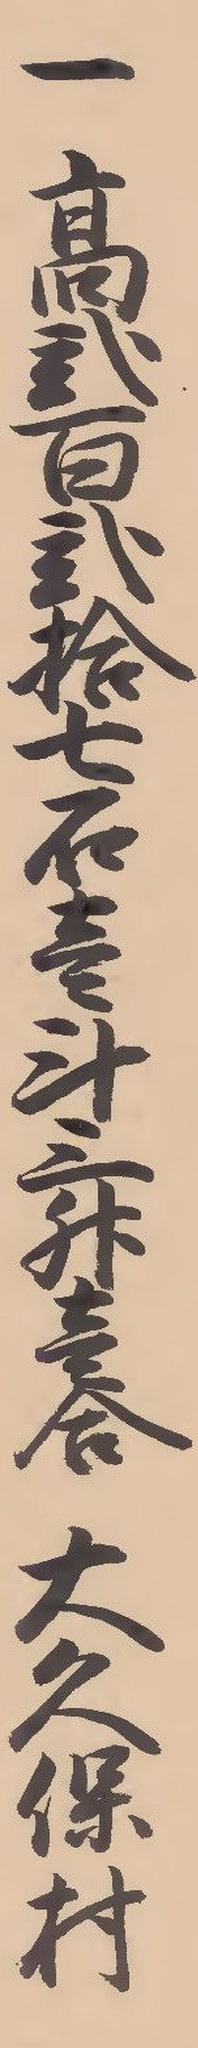一高弐百弐拾七石壱斗三升壱合大久保村

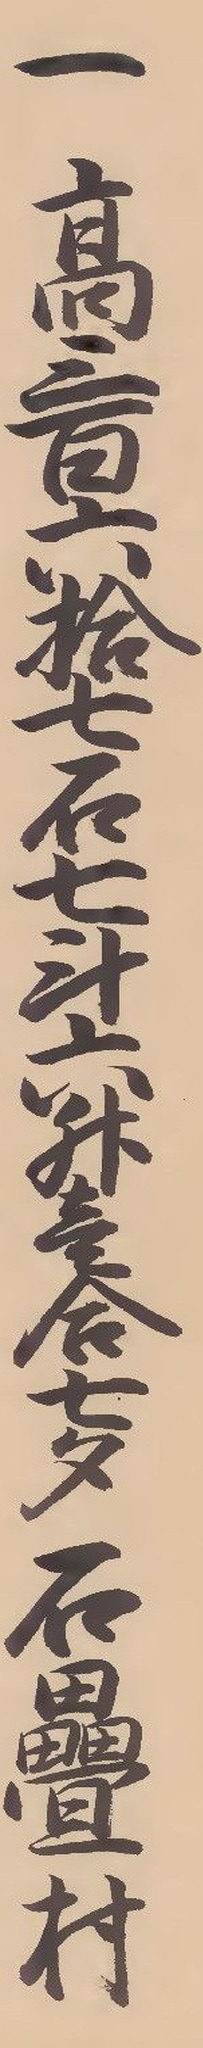一高三百六拾七石七斗六升壱合七勺石畳村
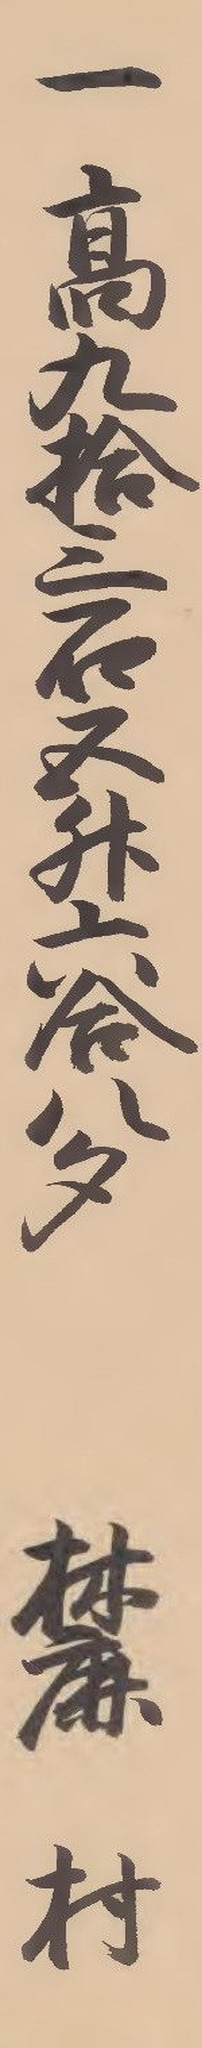一高九拾三石五升六合八勺麓村
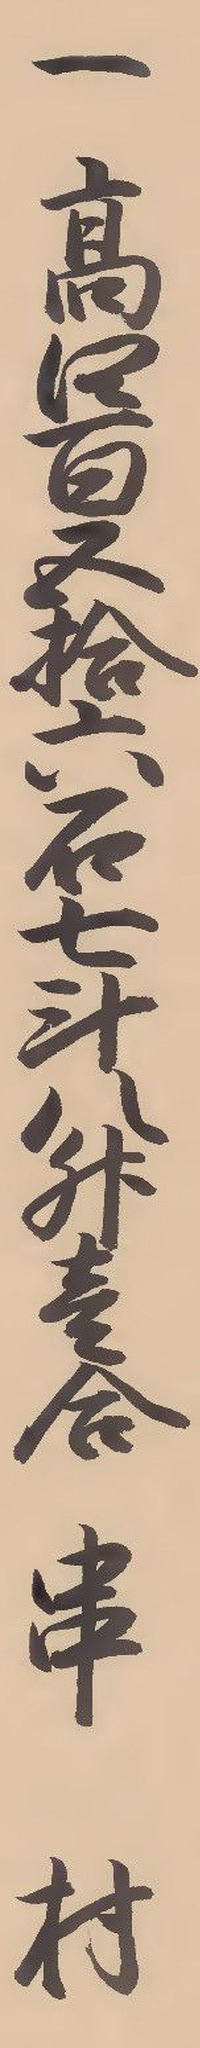一高四百五拾六石七斗八升壱合串村
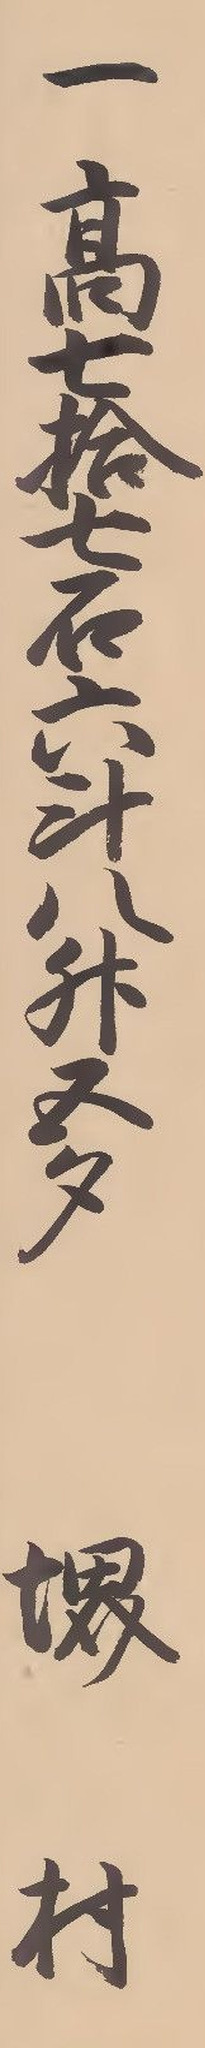一高七拾七石六斗八升五勺堺村
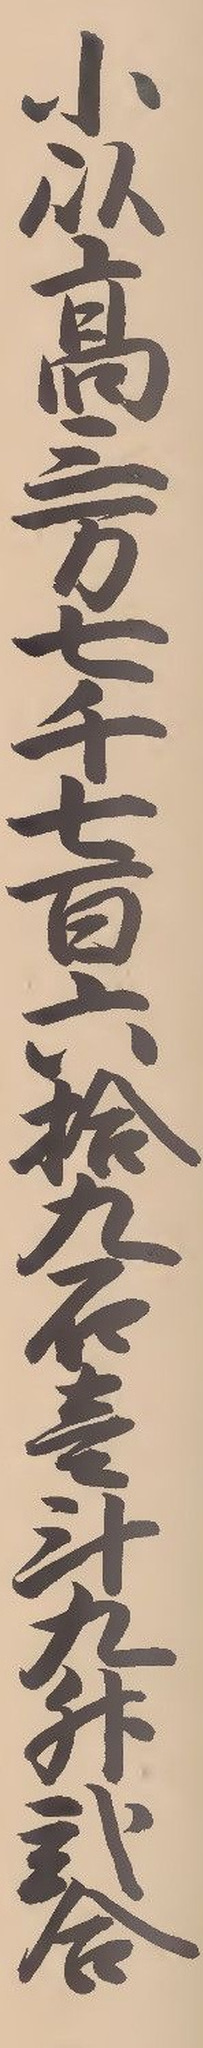小以高三万七千七百六拾九石壱斗九升弐合

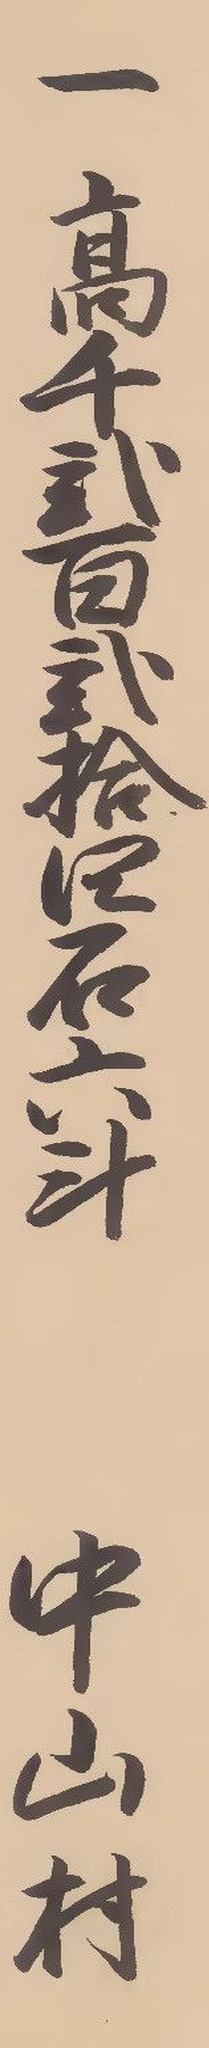一高千弐百弐拾四石六斗中山村
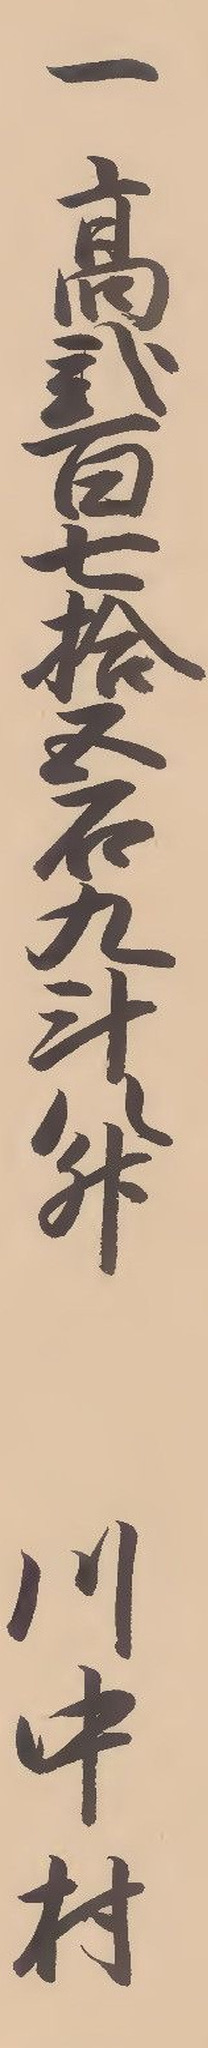一高弐百七拾五石九斗八升川中村
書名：伊予国郷帳
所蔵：国立公文書館 National Archives of Japan
